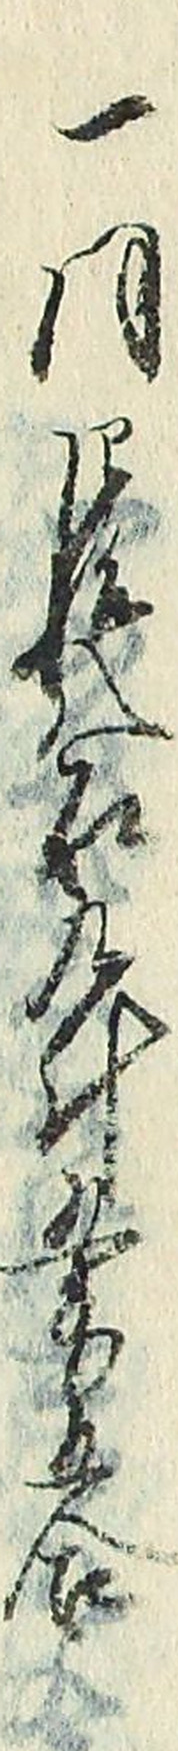一同四拾八石九斗五升五合
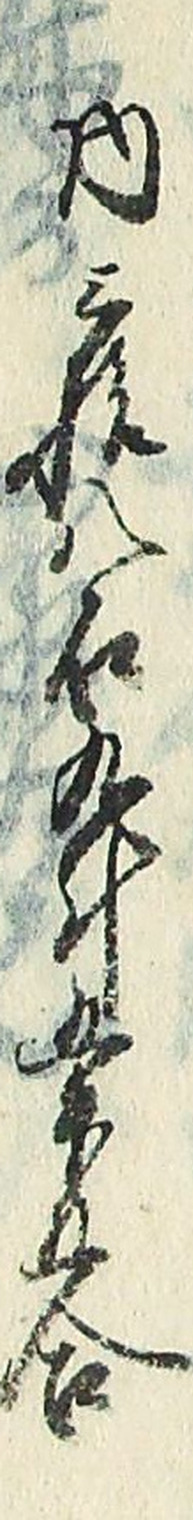一同四拾八石九斗五升五合
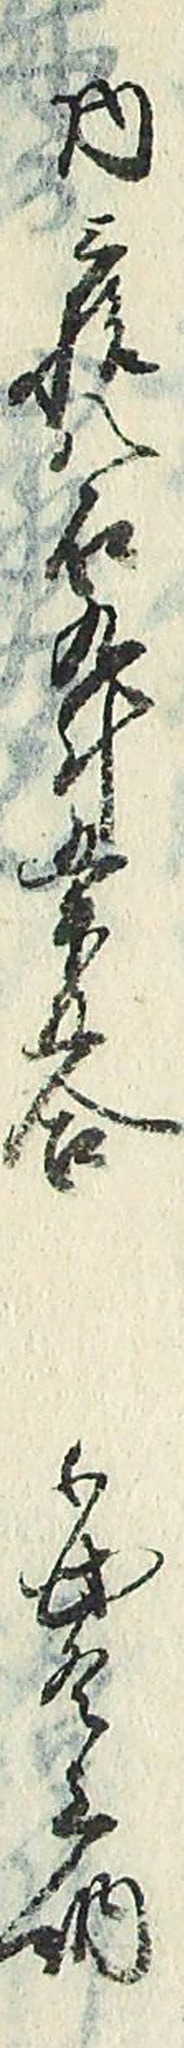内三拾八石九斗五升五合當冬上納
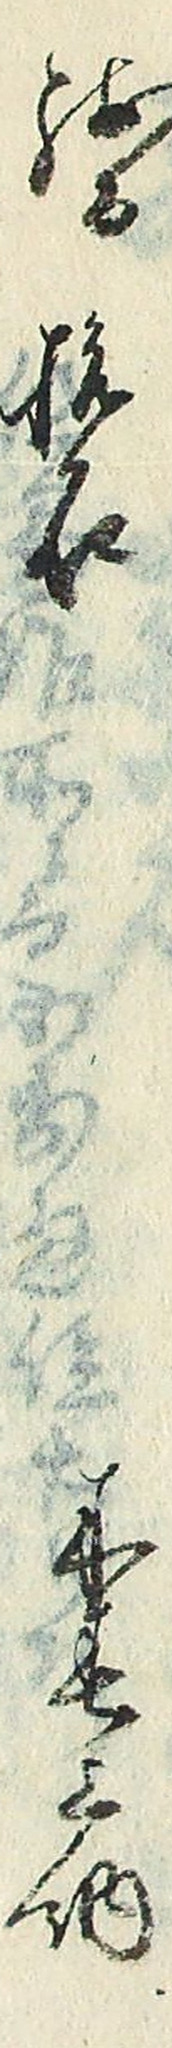残而拾石来春上納
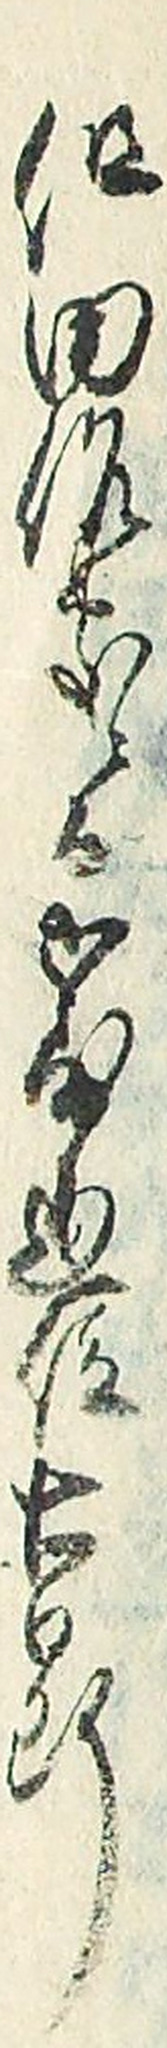但田作處ニ而弐歩通位右同断

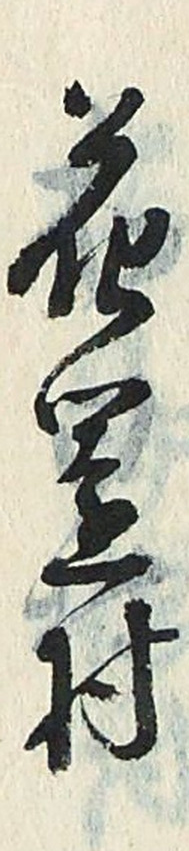花園村
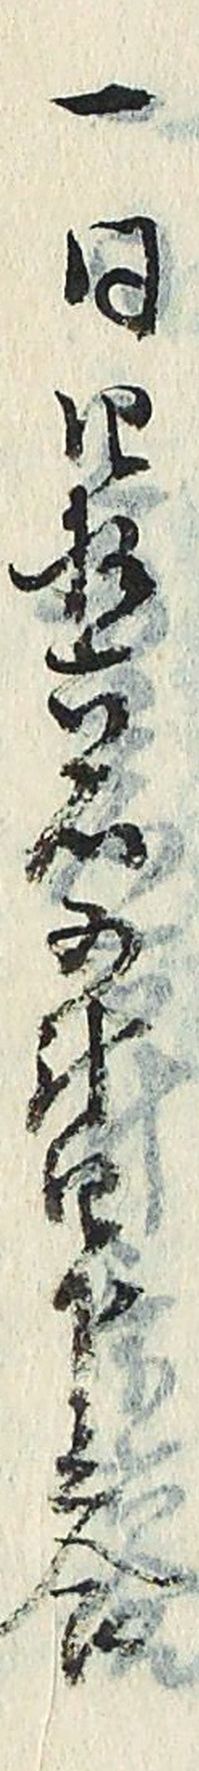一同四拾六石五斗四升壱合
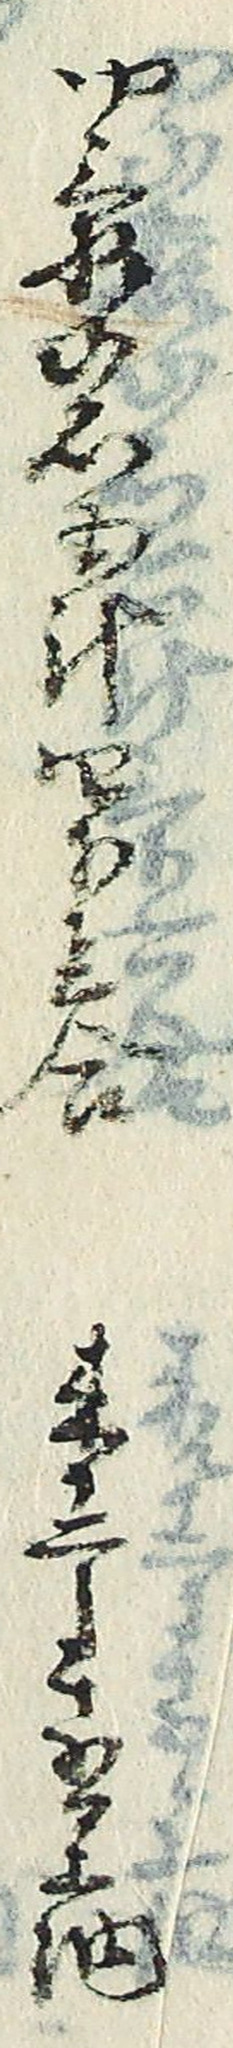内三拾弐石五斗四升壱合来十二月十五日上納
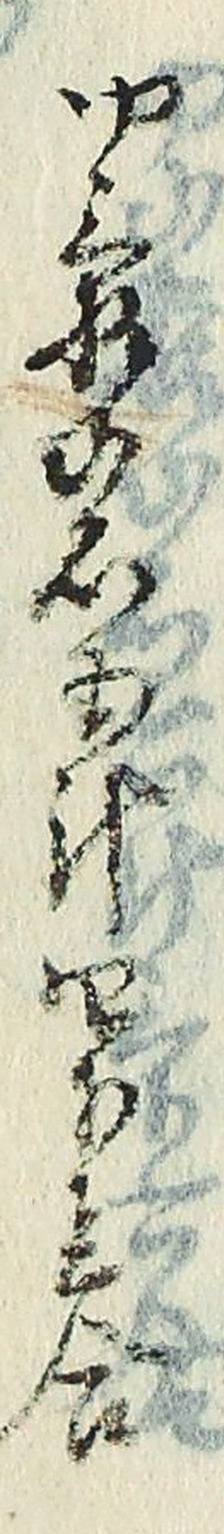一同四拾六石五斗四升壱合
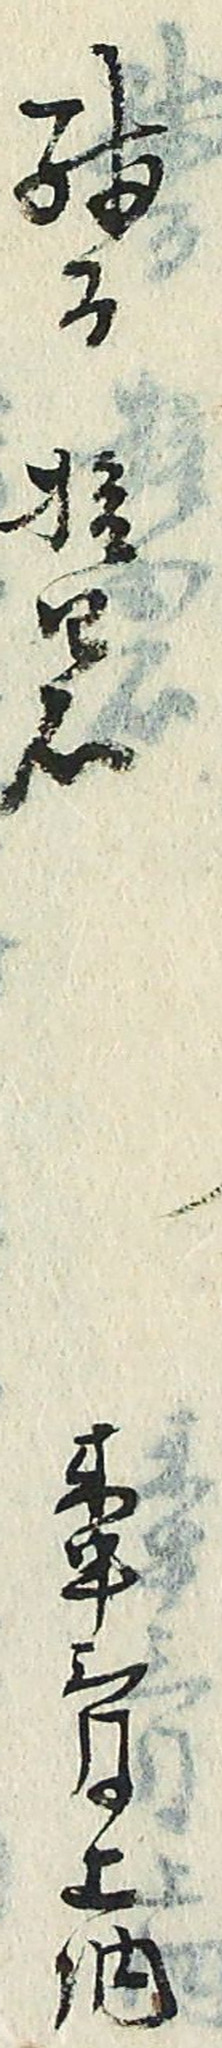残而拾四石来申三月上納
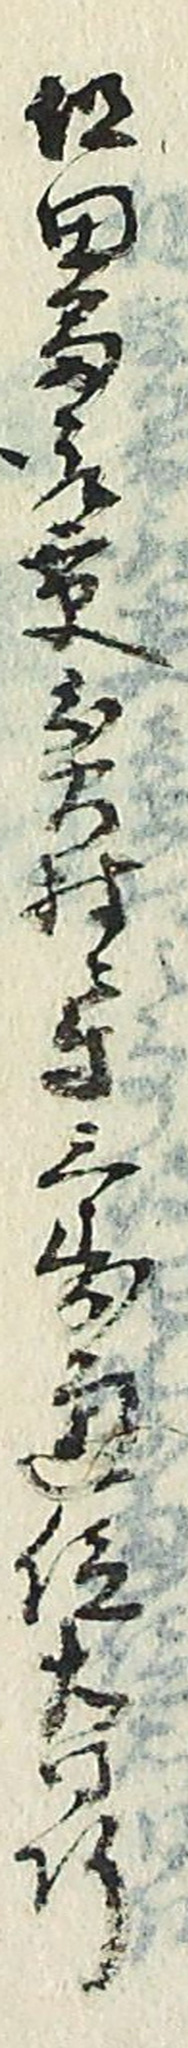但田畠取交貧村ニ付三歩通位右同断
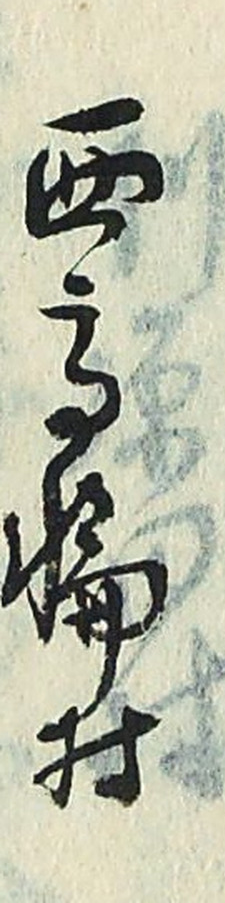西高輪村
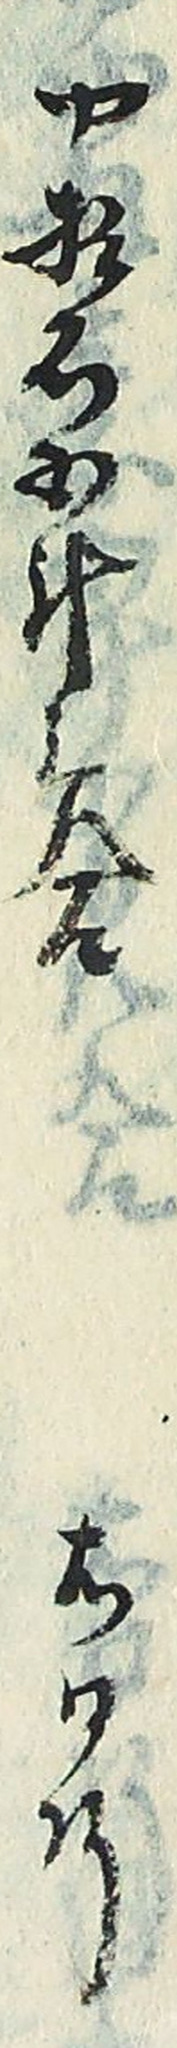内拾石五斗三合右同断
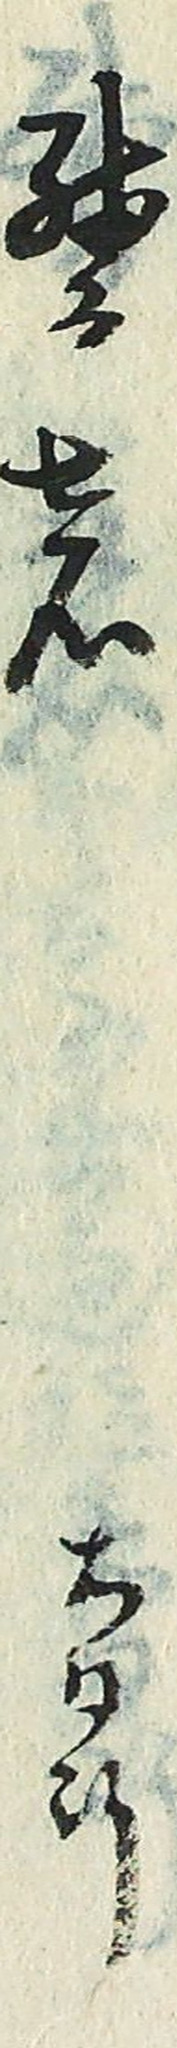残而七石右同断
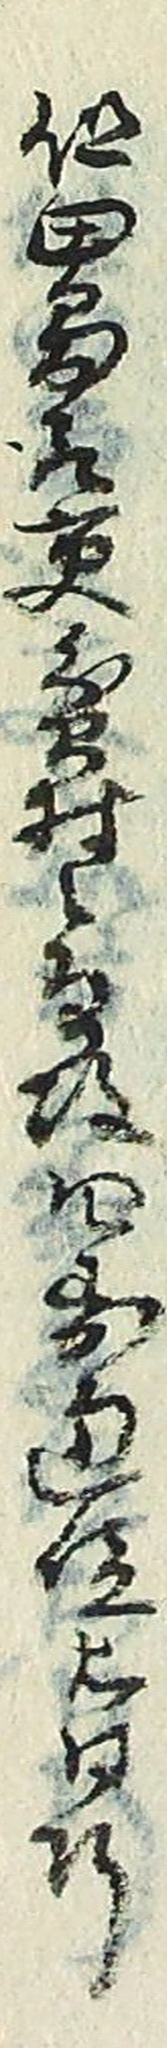但田畠取交貧村之事故四歩通位右同断
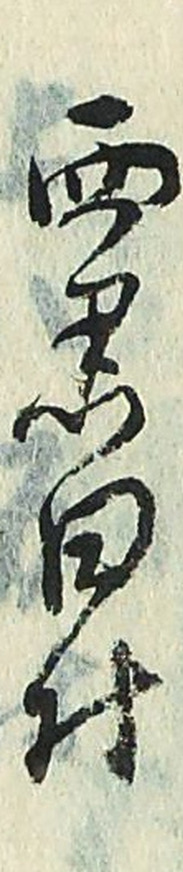西黒田村
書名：諸御趣意書并御下知向之写
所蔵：鳴門教育大学 Naruto University of Education
